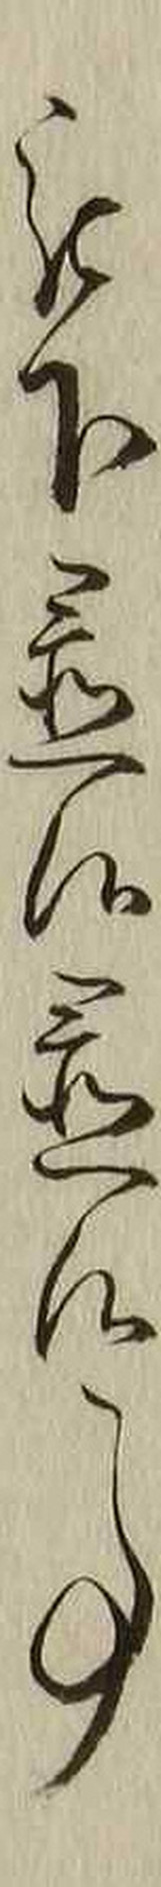被下置候置候事
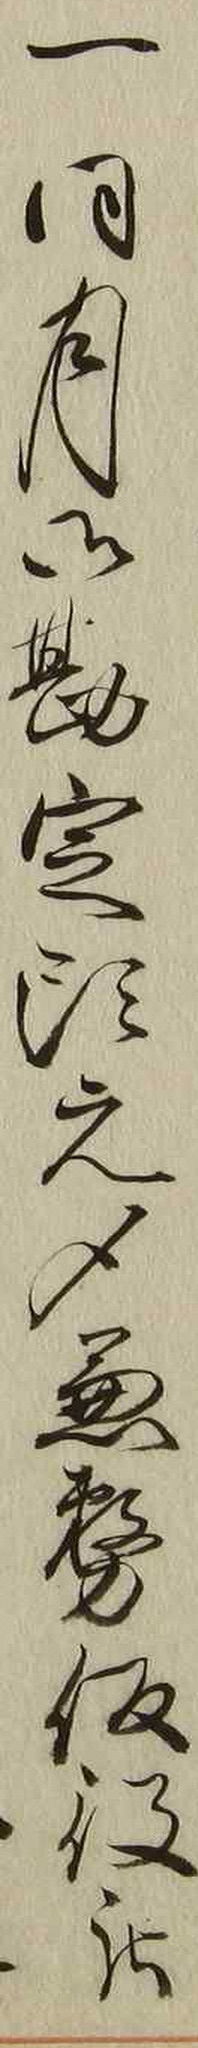一同月御勘定頭元〆兼務仮役被
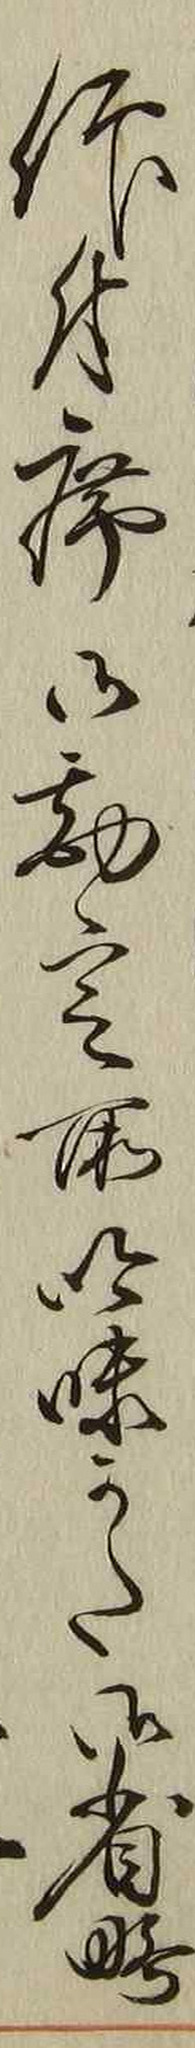仰付席御勘定所吟味かた御省略
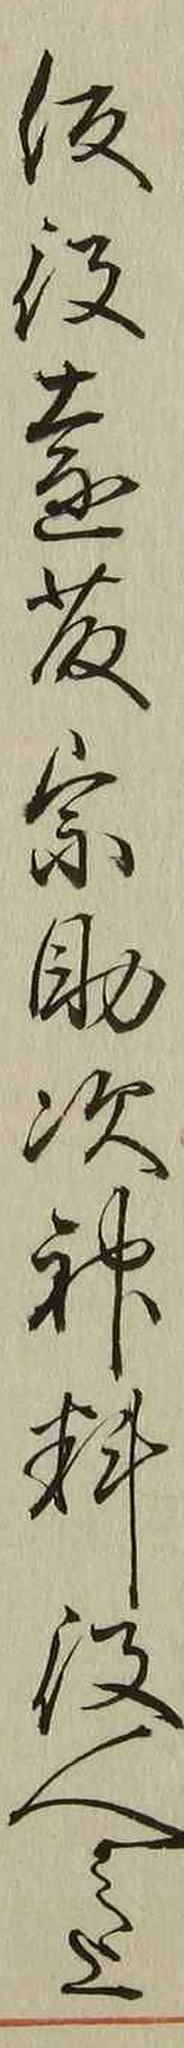仮役遠藤宗助次神料役人之上
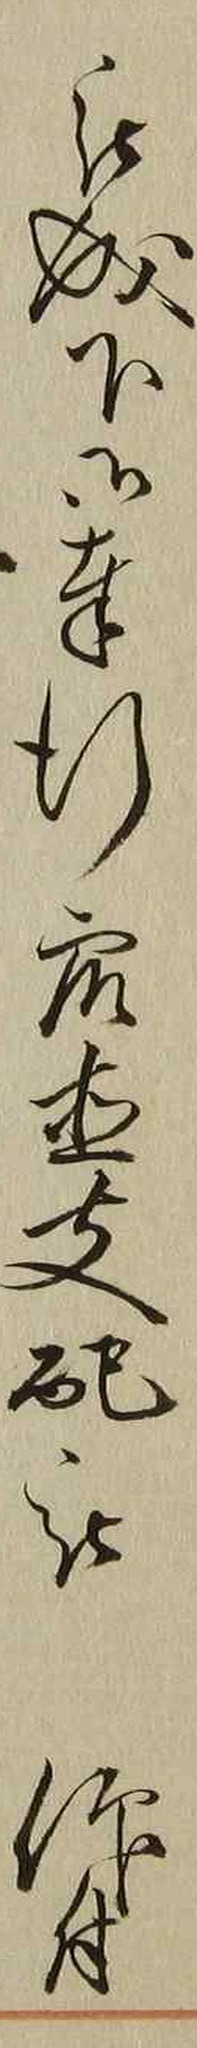被成下御奉行衆直支配被仰付
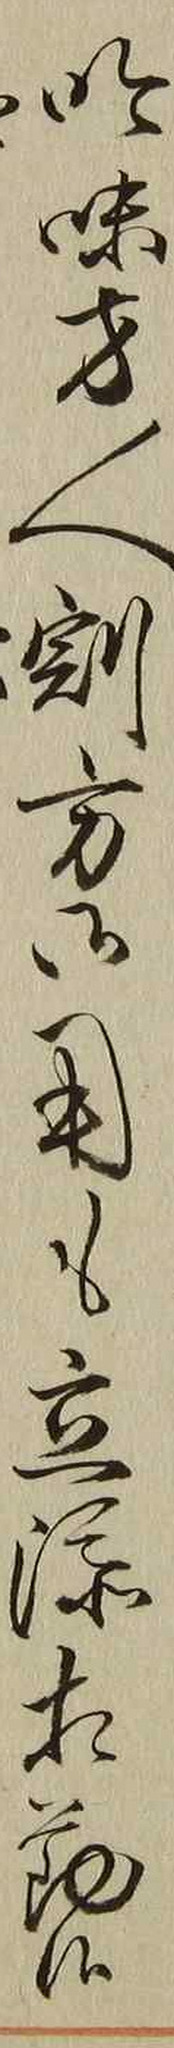吟味方人割方御用も立添相勤候
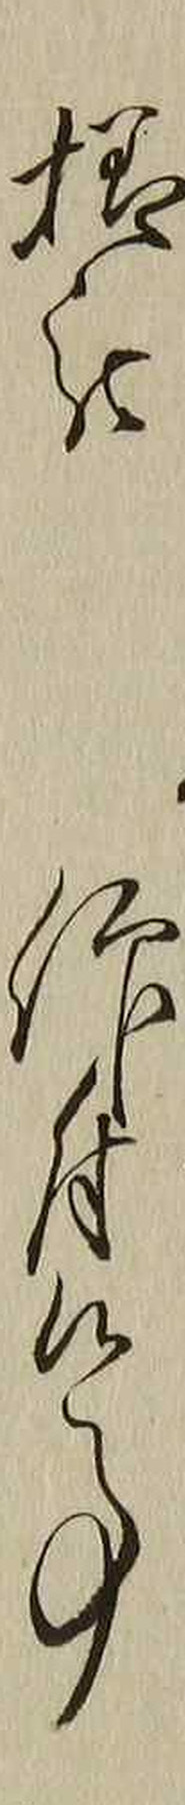様被仰付候事
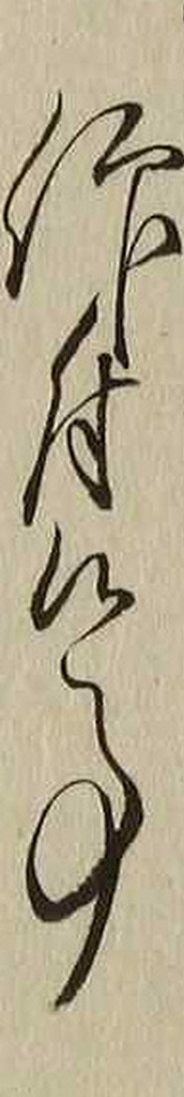仰付候事
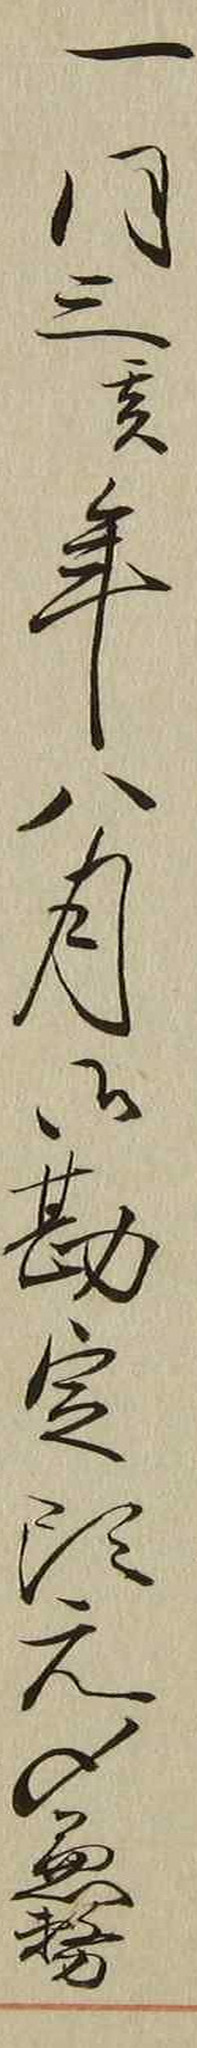一同三亥年八月御勘定頭元〆兼務
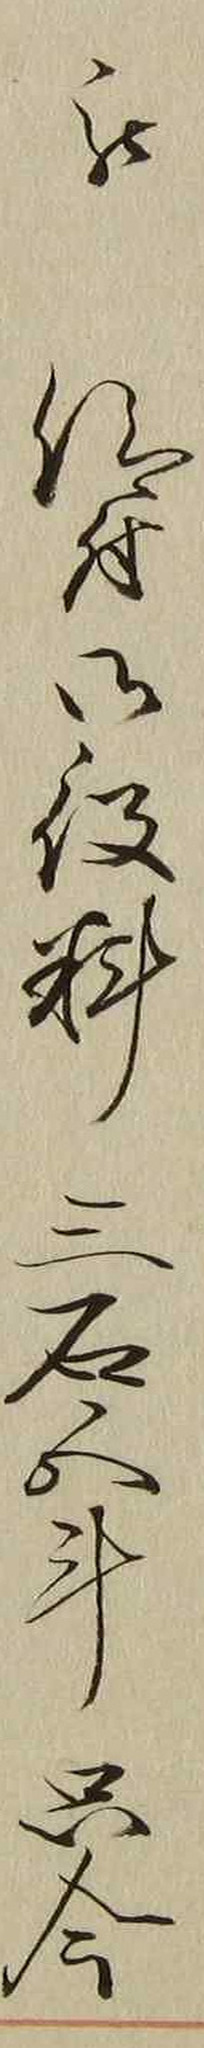被仰付御役料三石五斗只今
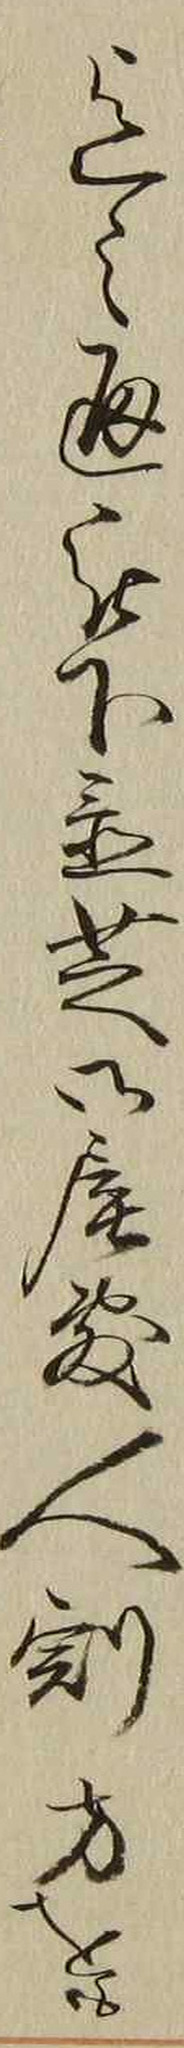迄之通被下置芝御屋敷人割方をも
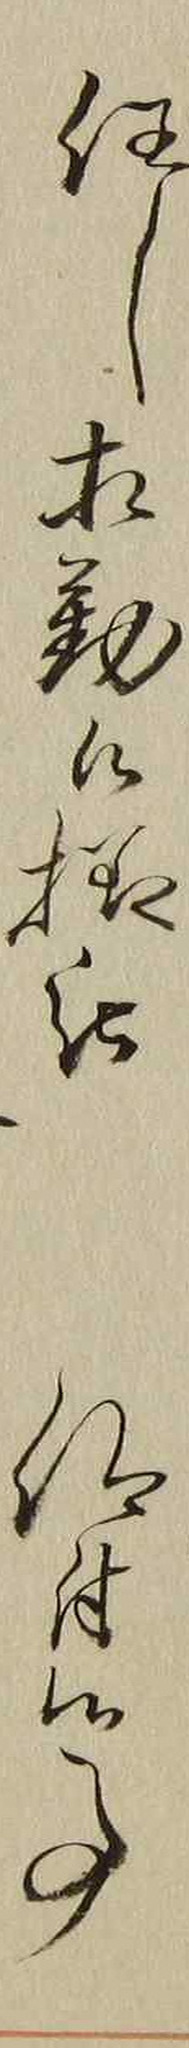任し相勤候様被仰付候事
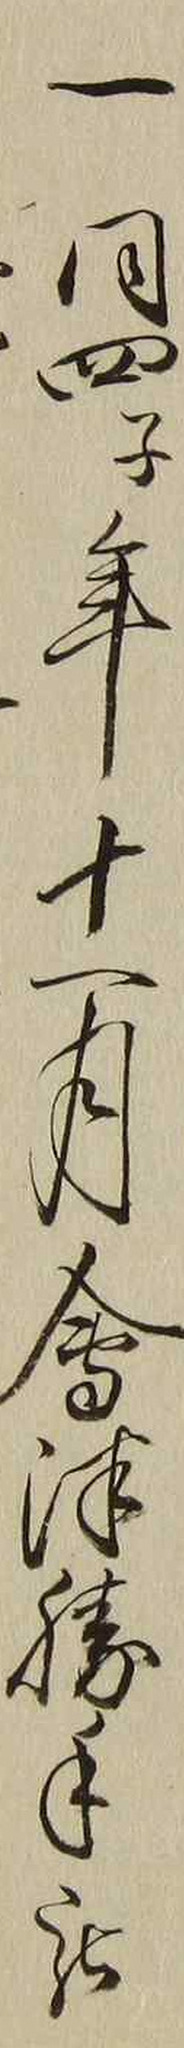一同四子年十一月会津勝手被
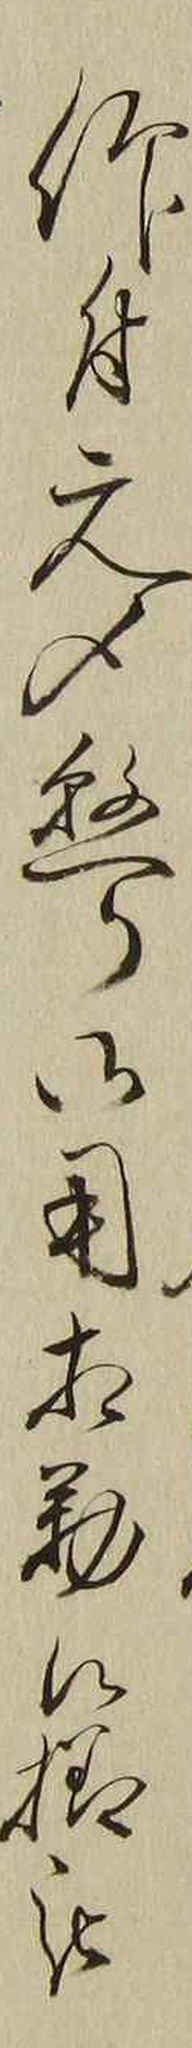仰付元〆懸り御用相勤候様被
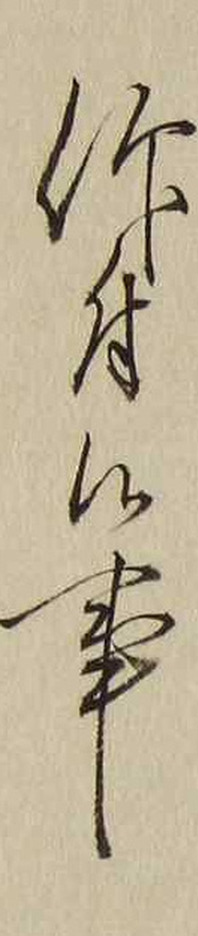仰付候事

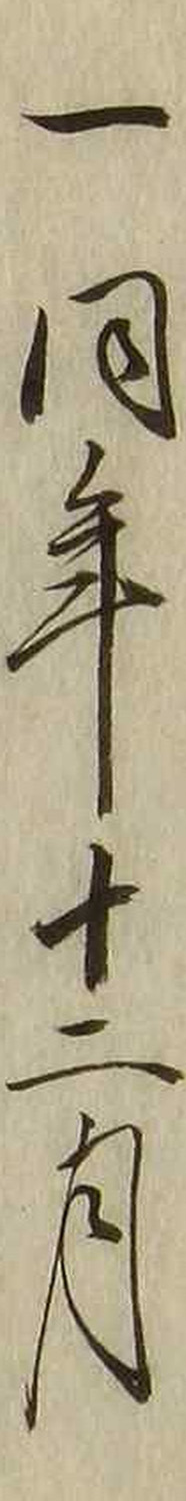一同年十二月
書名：諸士系譜　巻之57　ほ之部4
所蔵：会津若松市立会津図書館
